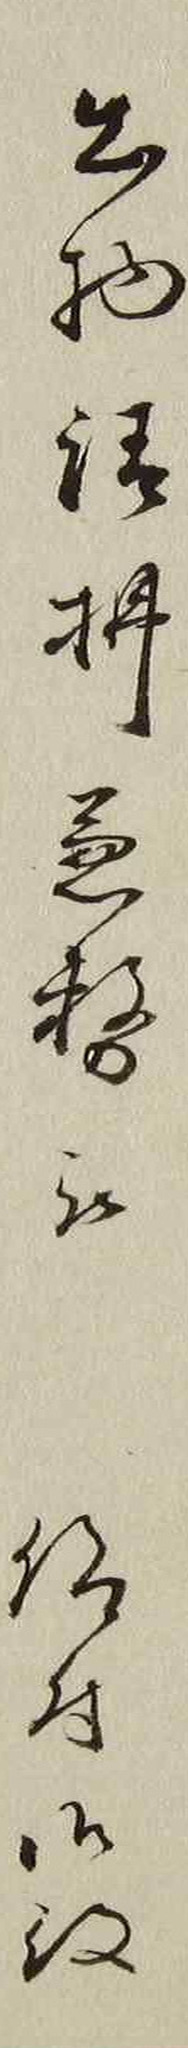書物請払兼務被仰付御役
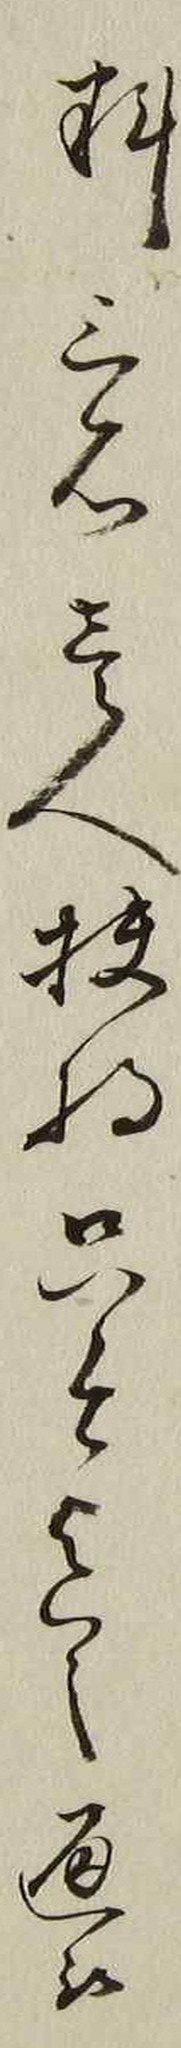料三石壱人扶持只今迄之通被
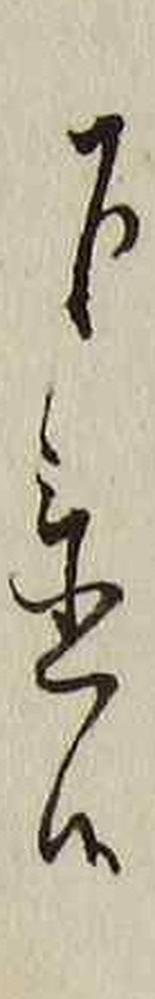下置候
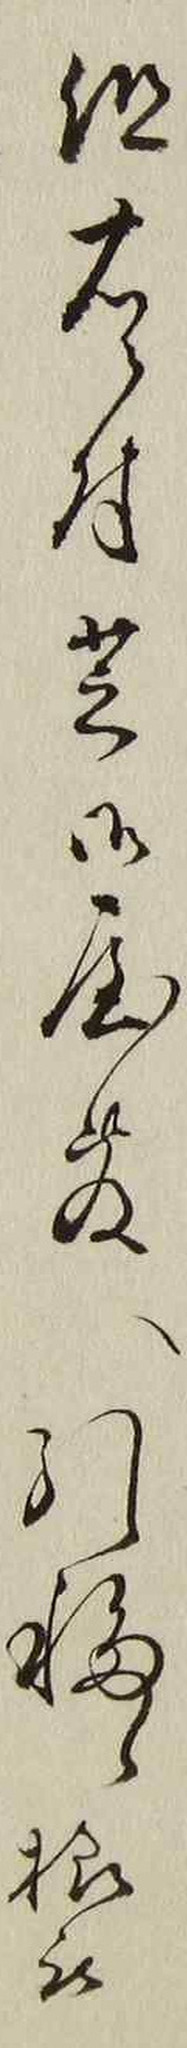但右ニ付芝御屋敷へ引候様被
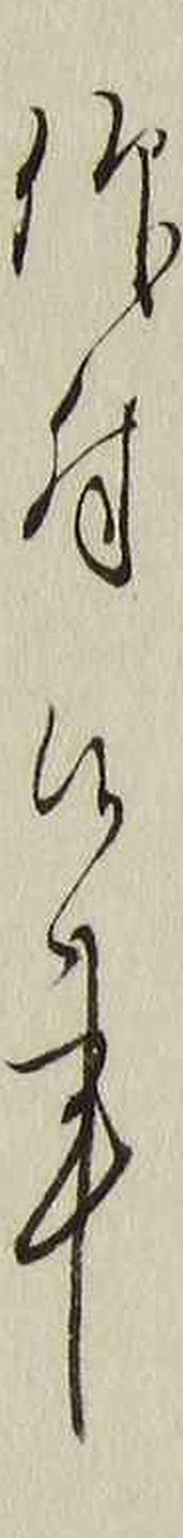仰付候事
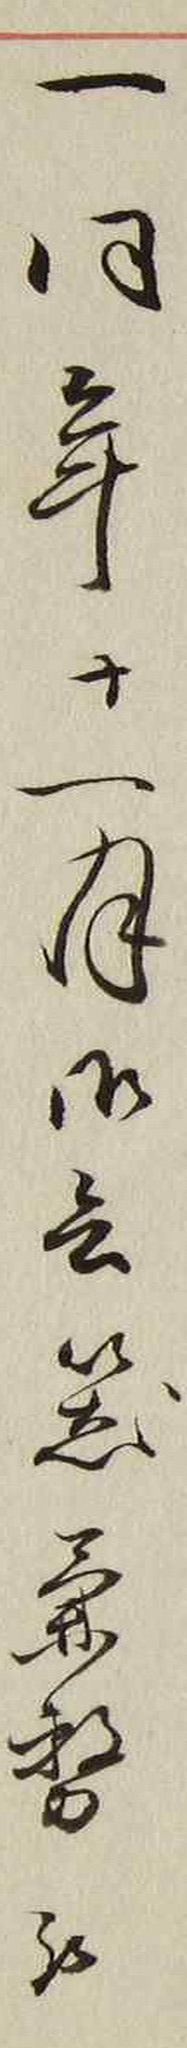一同年十一月御兵器兼務被
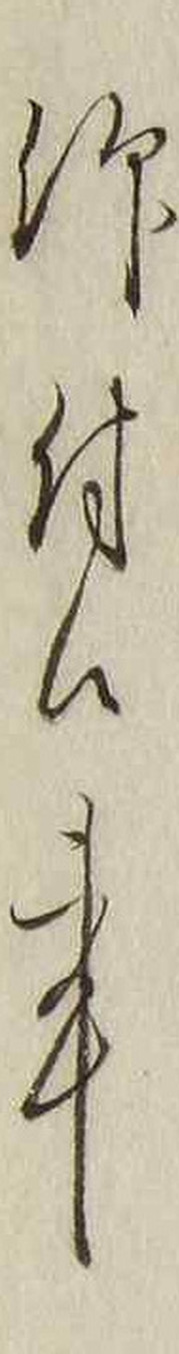仰付候事

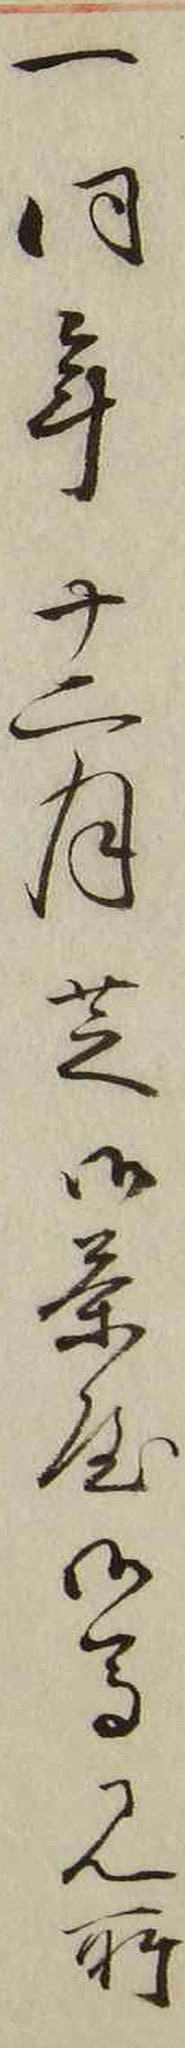一同年十二月芝御茶屋御馬見所
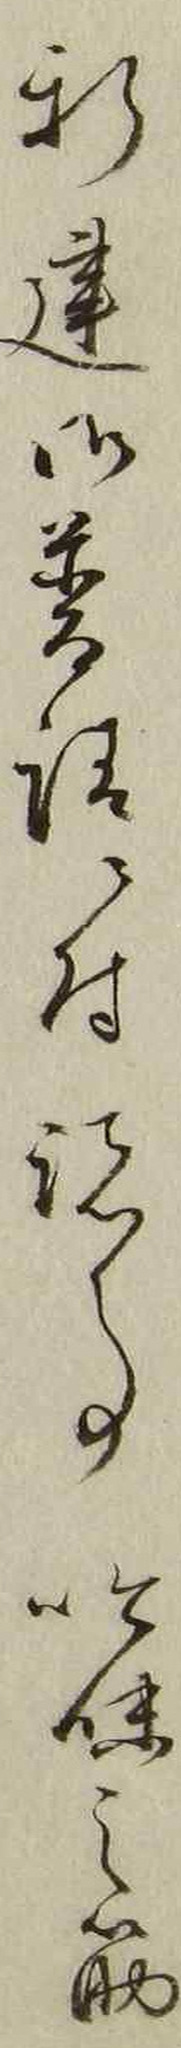新建御普請ニ付諸事吟味之筋
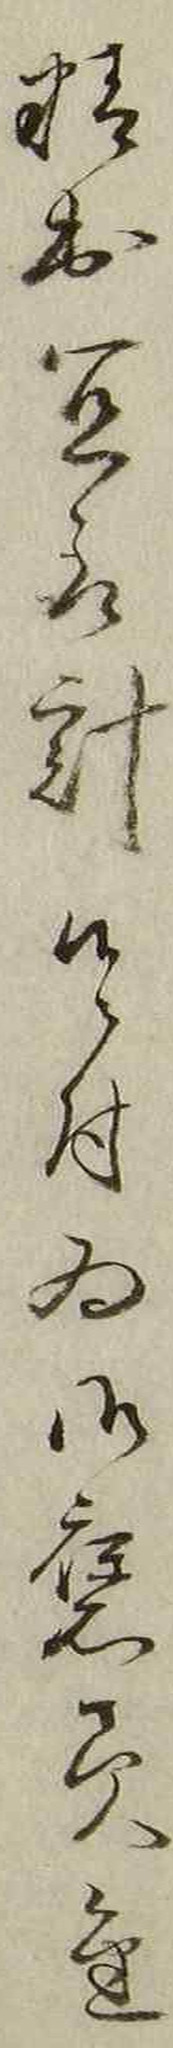精出宜取計候ニ付為御褒美金
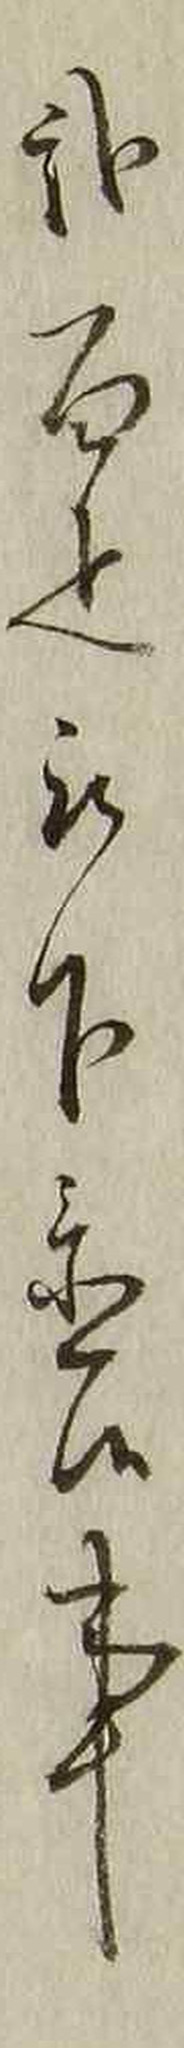弐百疋被下置候事
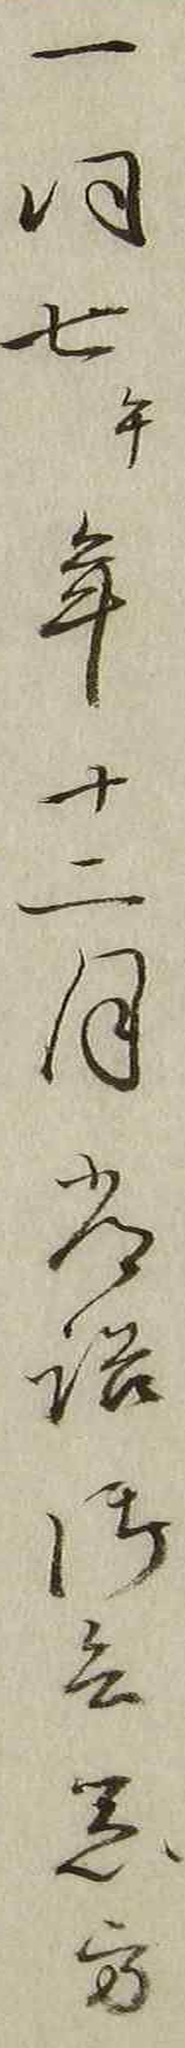一同七午年十二月常詰御兵器方
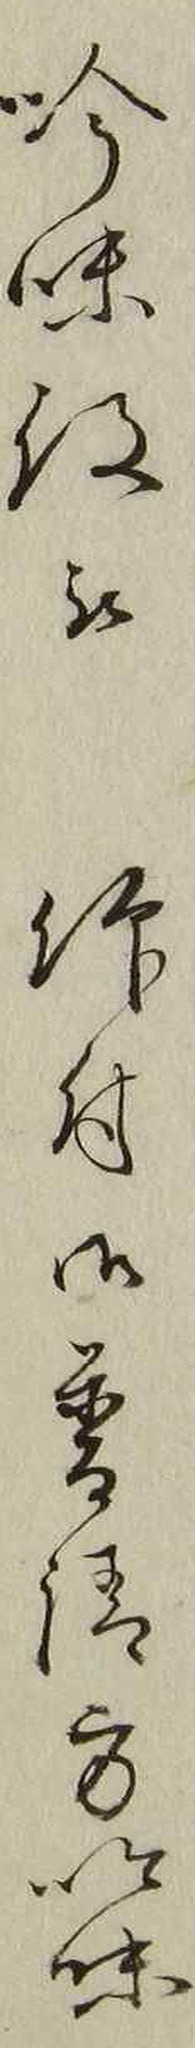吟味役被仰付御普請方吟味
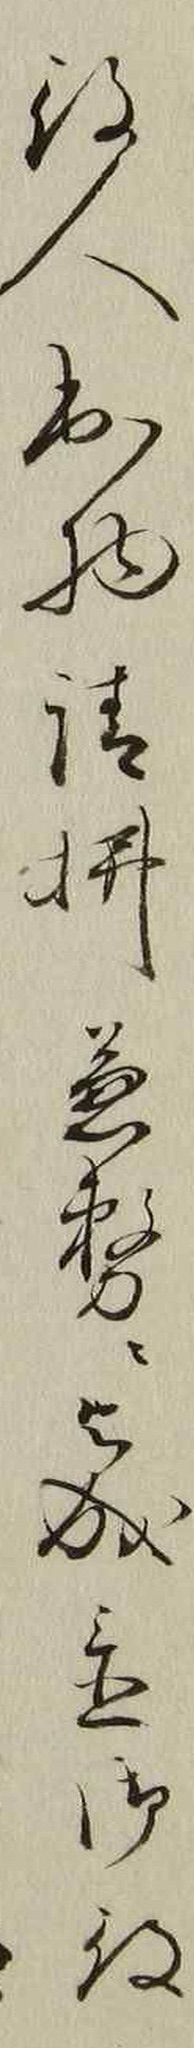役人書物請払兼務ニ被成置御役
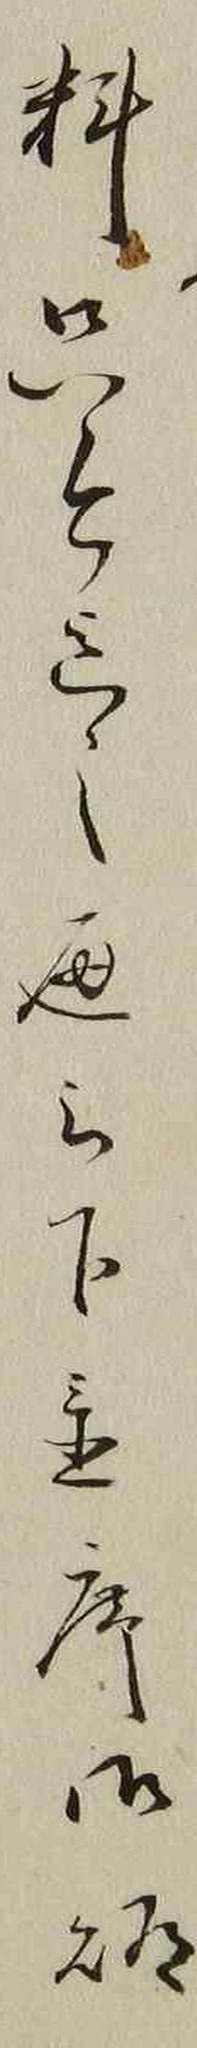料只今迄之通被下置席御賄
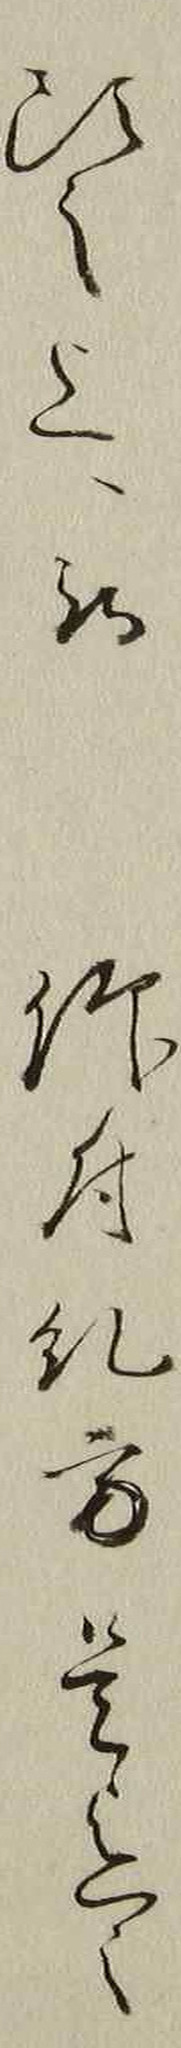頭之上へ被仰付糺方是迄之
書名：諸士系譜　巻之8　い之部8
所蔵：会津若松市立会津図書館
